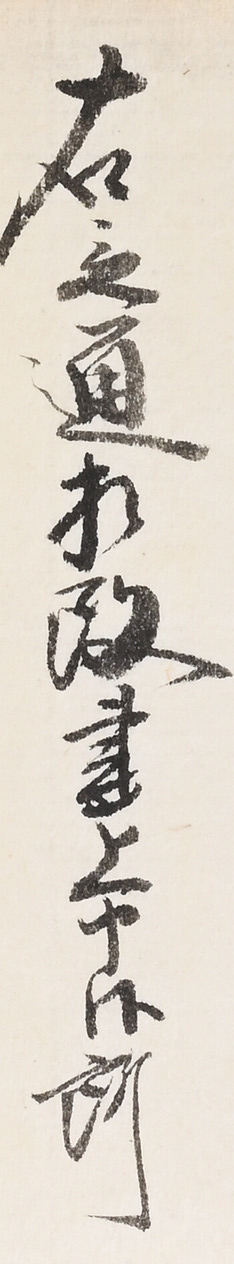右之通相改書上申候処
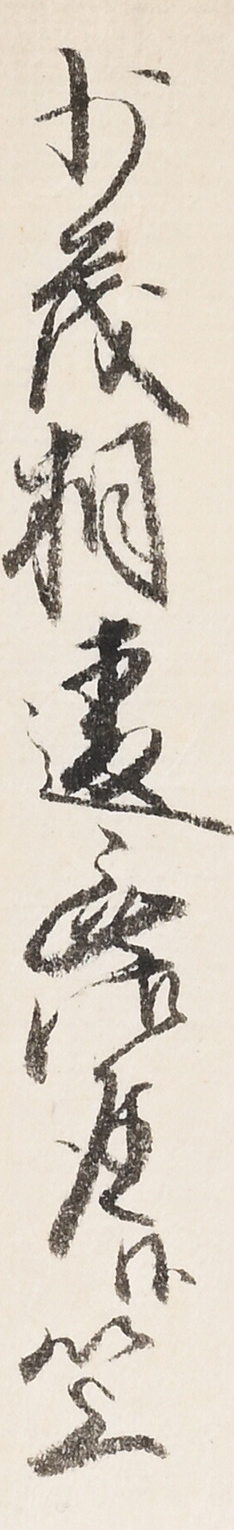少も相違無御座候以上
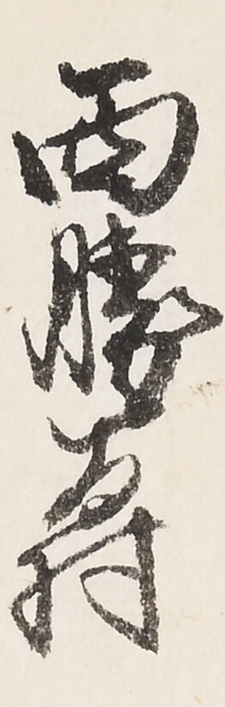西勝間村
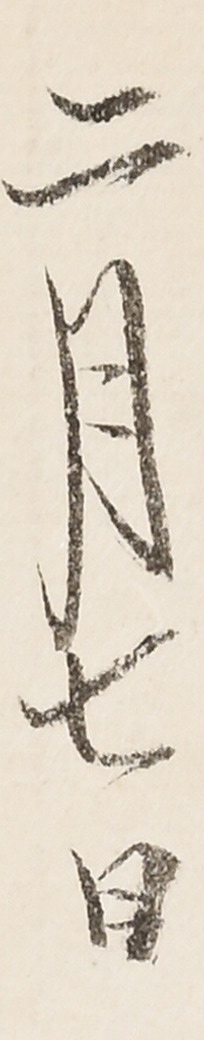二月七日
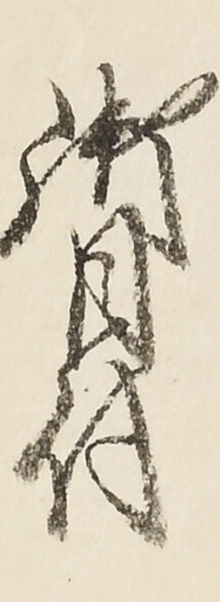御目付
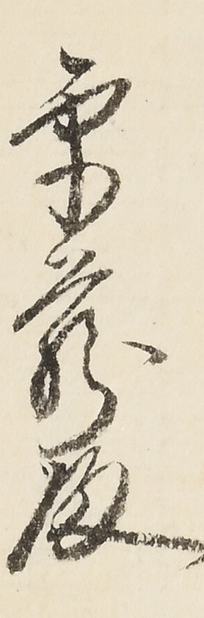平蔵殿
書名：安政六己未年二月旅出石切職之者名前書上帳
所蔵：伊那市立高遠町図書館・合同会社AMANE
